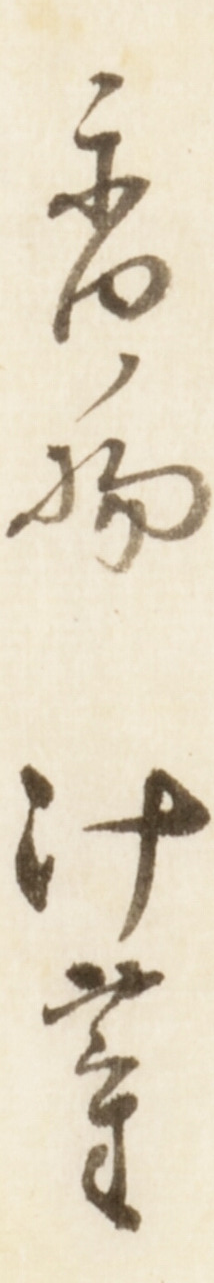香ノ物汁菜
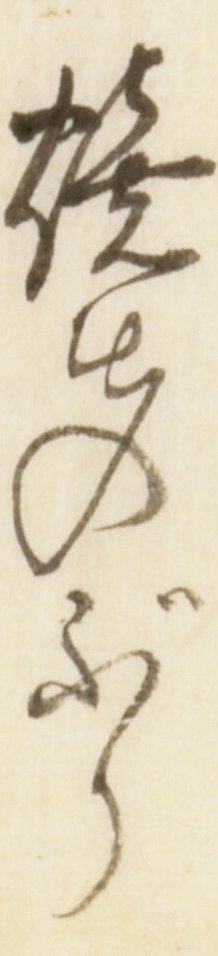焼ものぶり
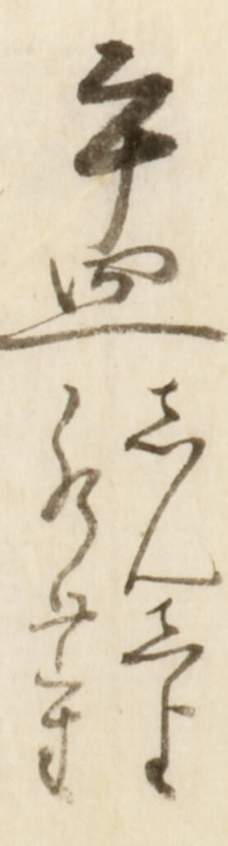平皿しんしよ

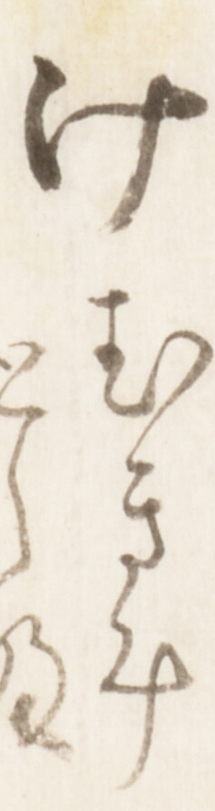汁むきみ
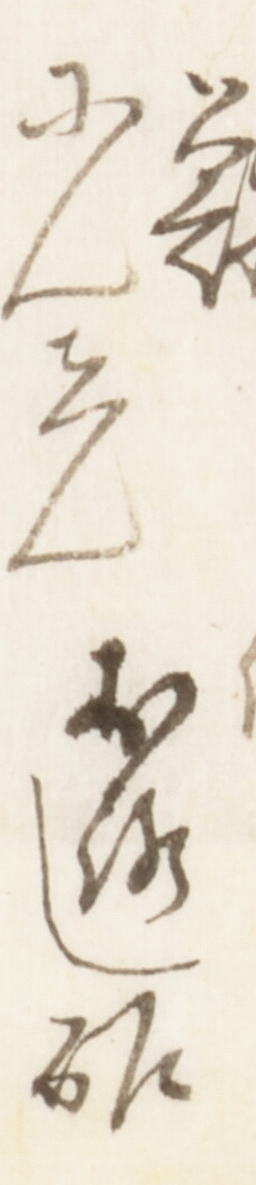にんしんおろし酢
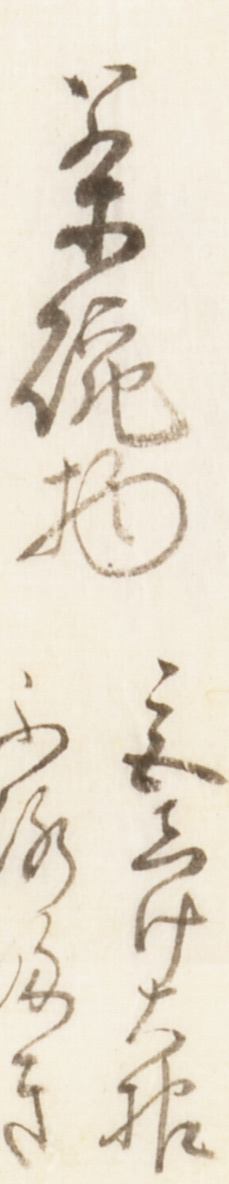茶碗物宮しけ大根
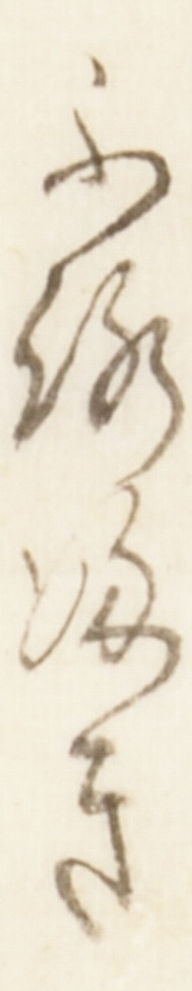ふろふき
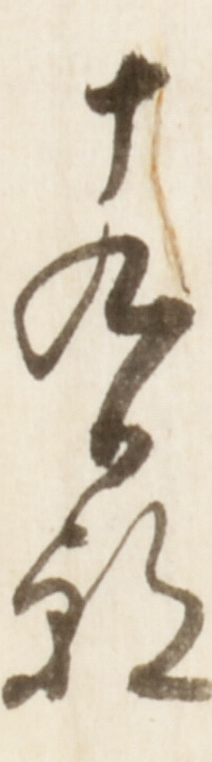十九日朝
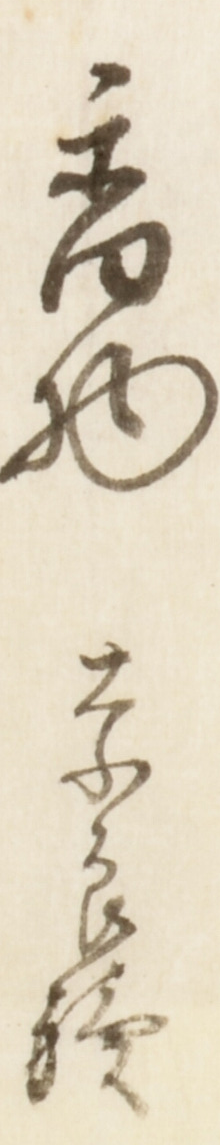香物奈良漬
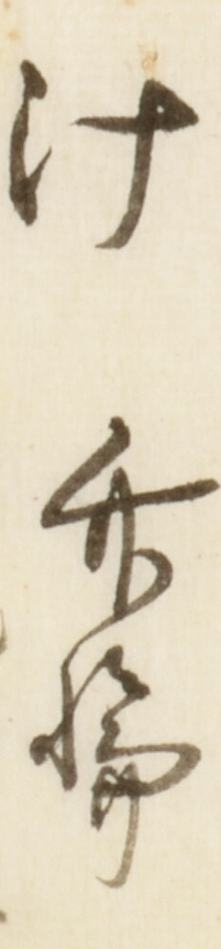汁竹輪
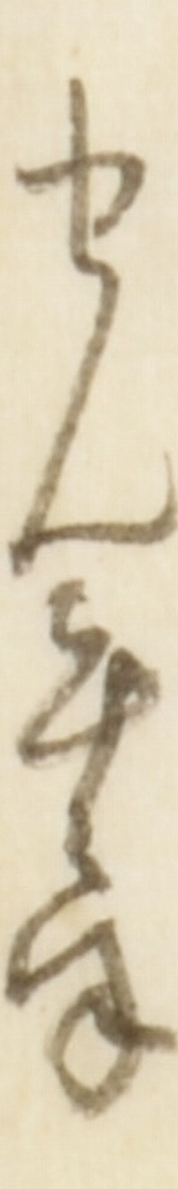せん午房

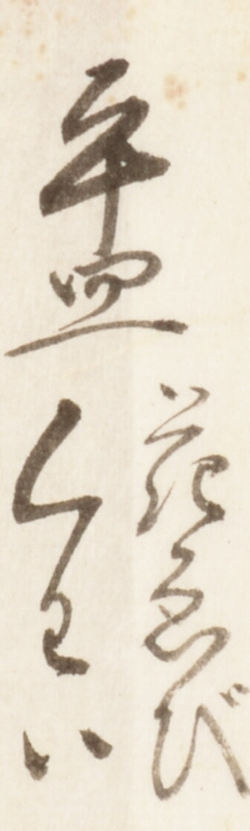平皿花えび
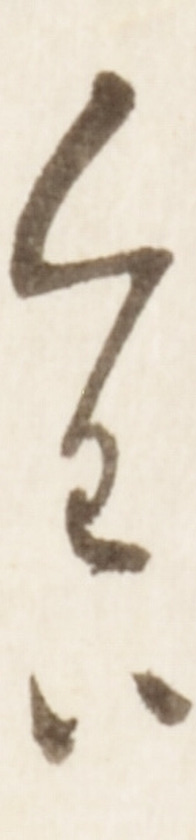くわい
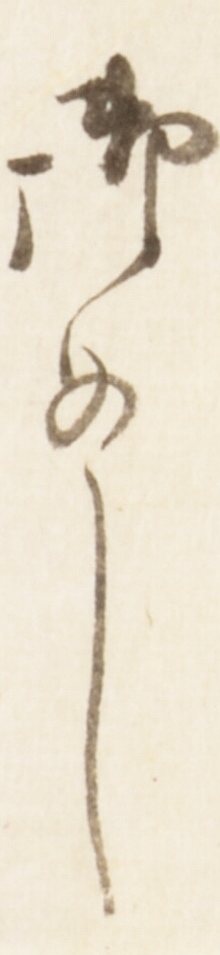御めし
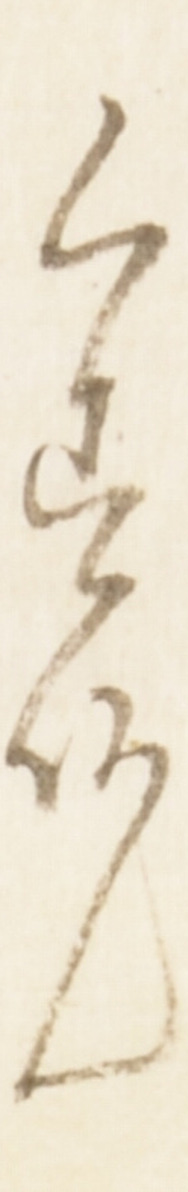くすあん
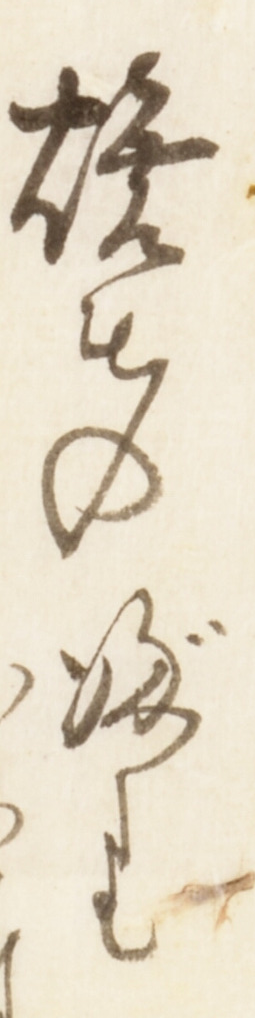焼ものぶり
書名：（諸事控）
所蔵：伊那市立高遠町図書館・合同会社AMANE
